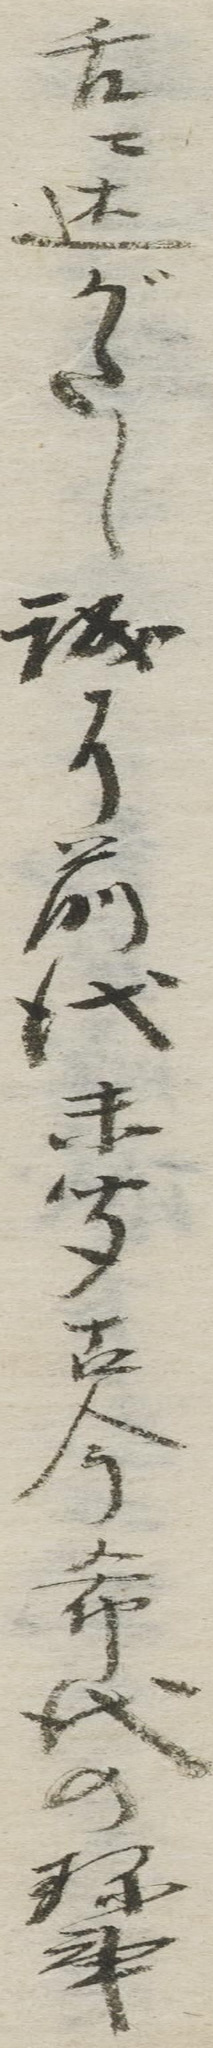舌ニ述がたし誠に前代未聞古今希代の珍事
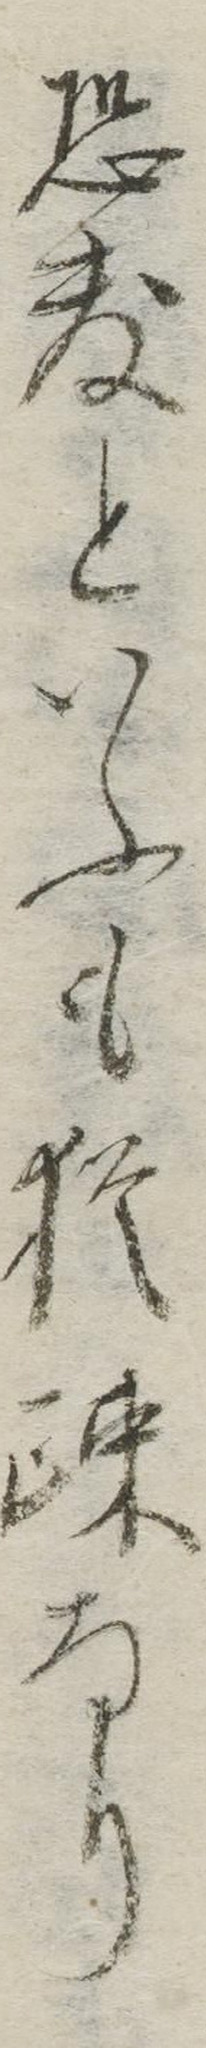恐敷といふも猶疎なり

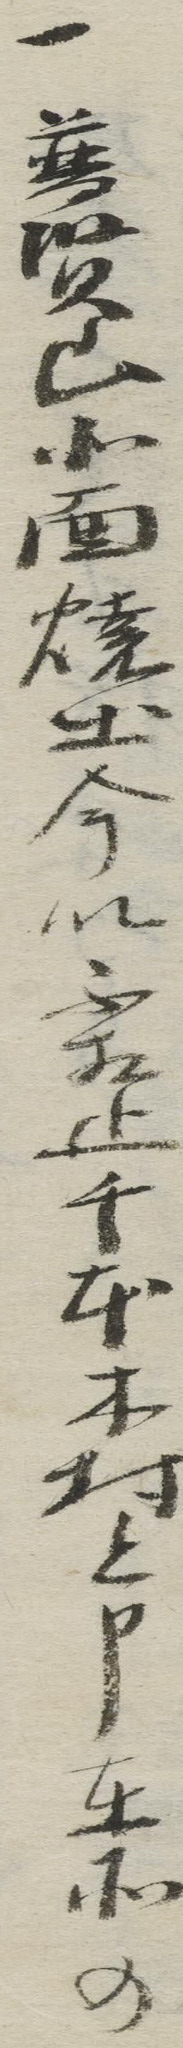一普賢山所北面焼出今以不相止千本木村と申在所の
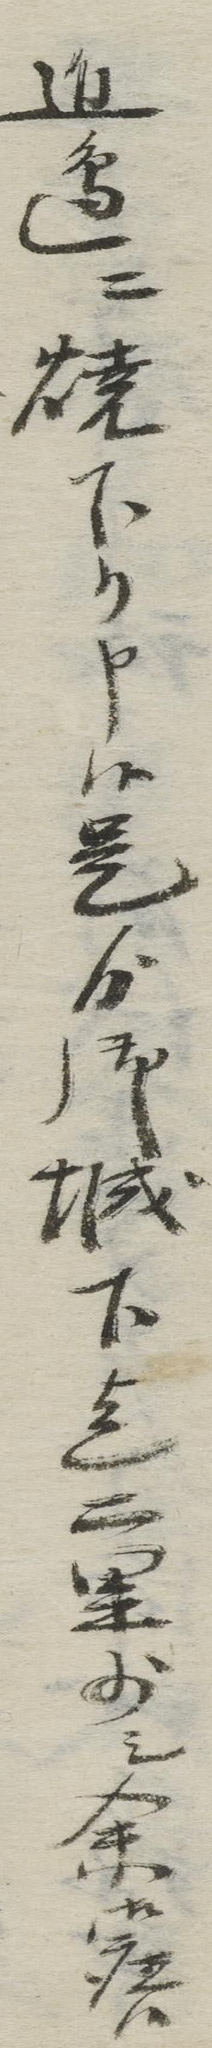近辺ニ焼下り申候是ゟ御城下迄二里少シ余御座候
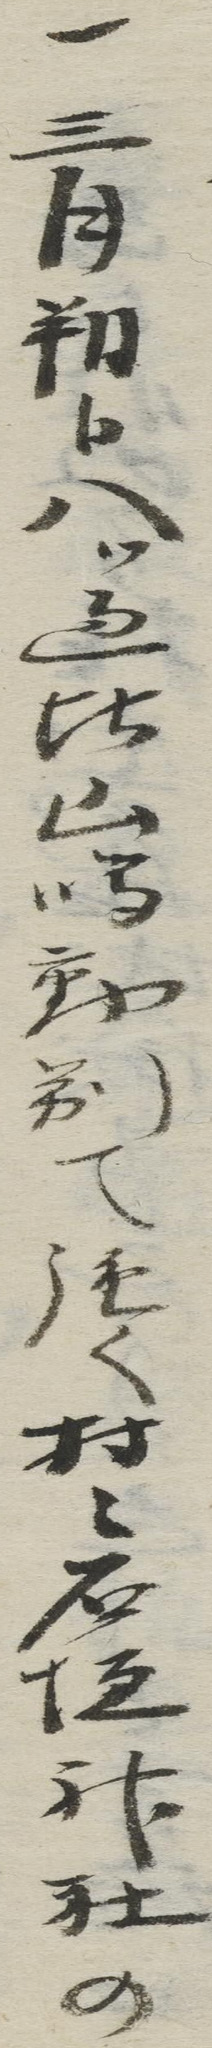一三月朔日八ツ過此山鳴動別て強く村〻石垣神社の
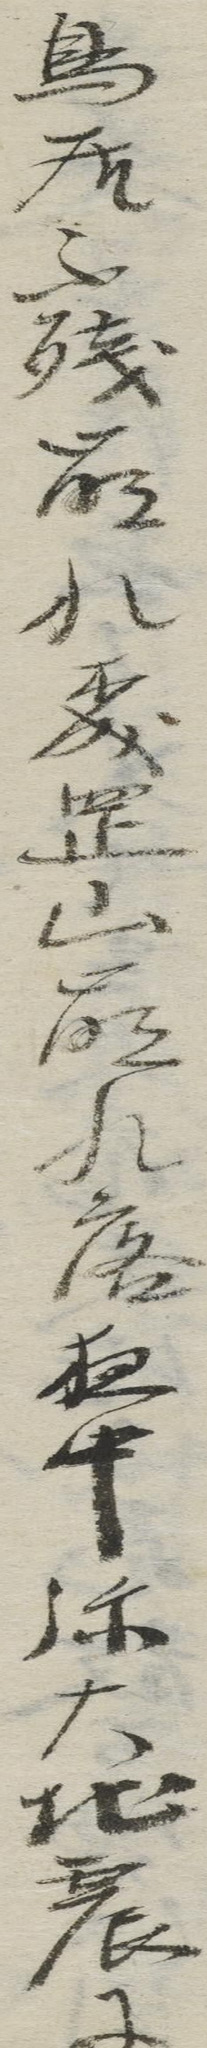鳥居不残崩れ森岡山崩れ落夜中に大地震に
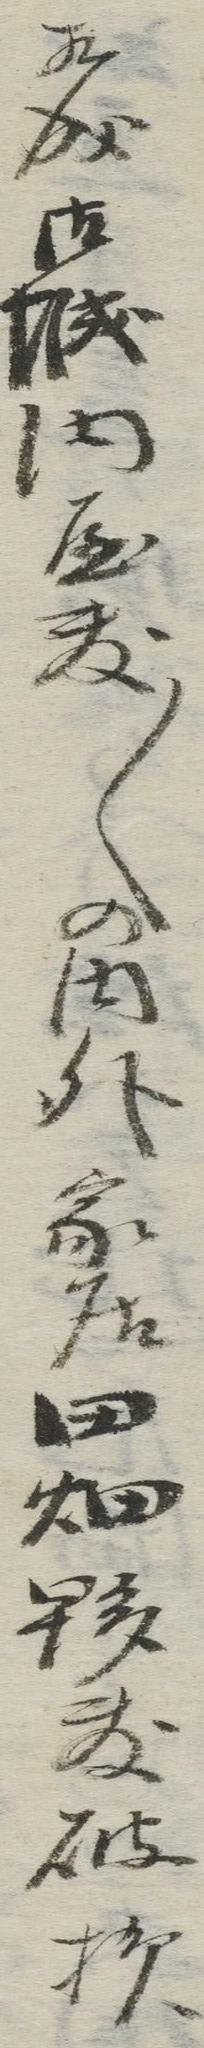相成御城内屋敷〳〵の内外家居田畑夥敷破損
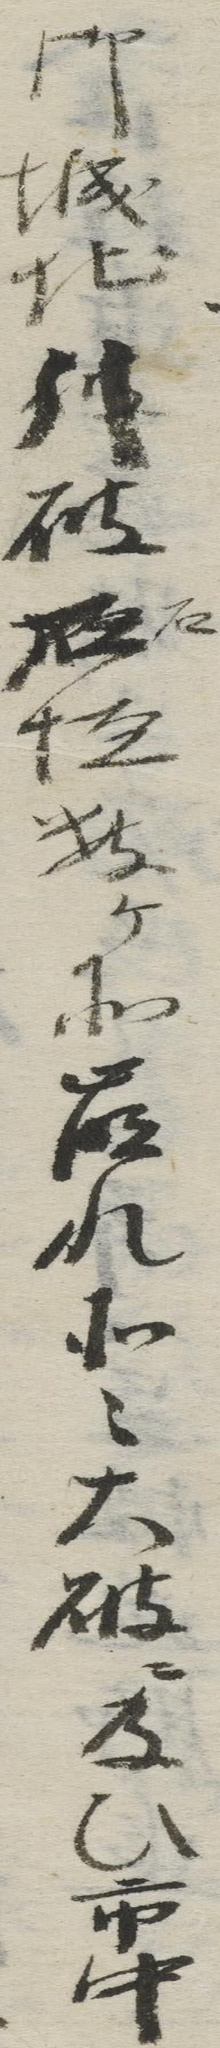御城北引破石垣数ケ所崩れ所〻大破ニ及ひ市中
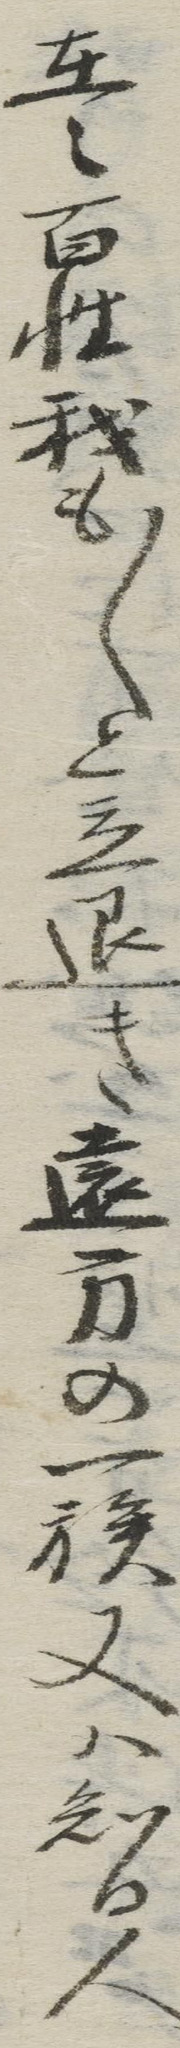在〻百姓我も〳〵と立退き遠方の一族又ハ知る人
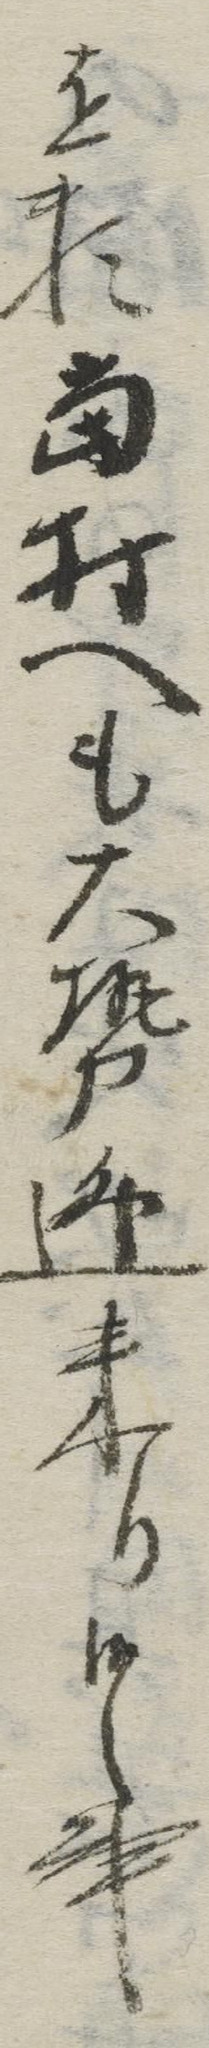を頼当村へも大勢迎来り候之事
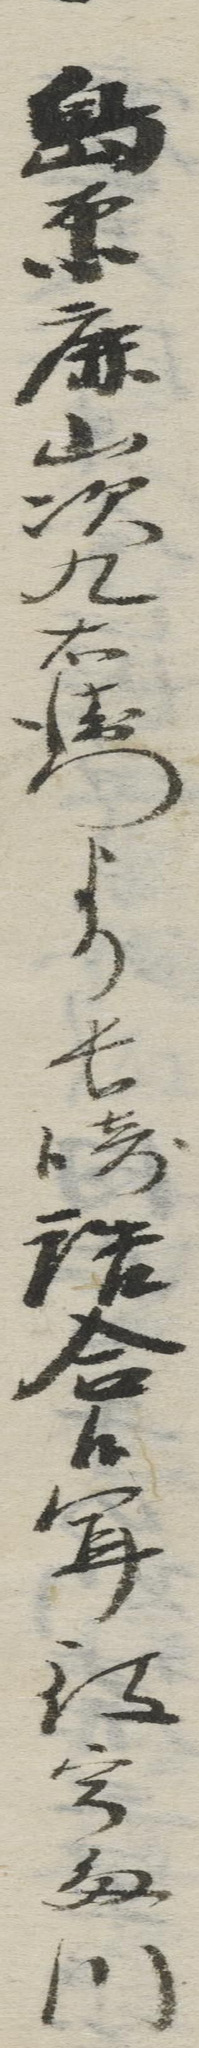一島原鹿山次九右衛門より長崎詰合候聞役宇多川
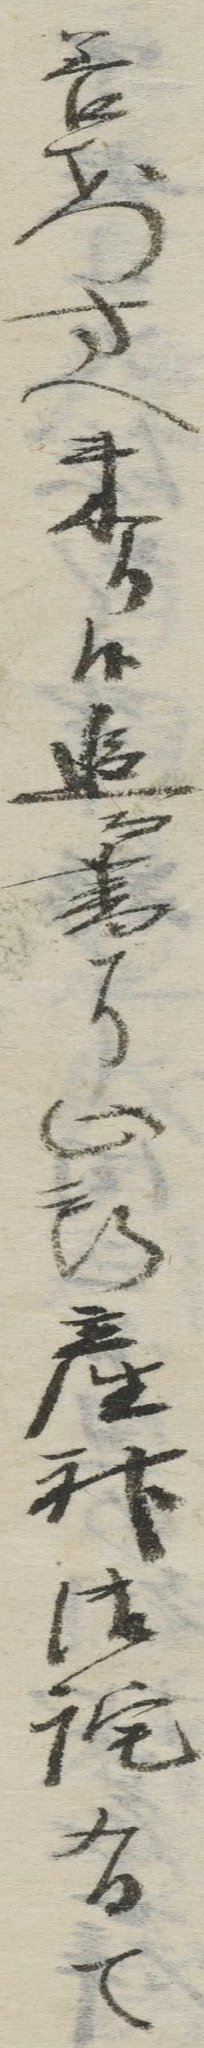善衛門方へ来り候追て書に此所産神御詫有て
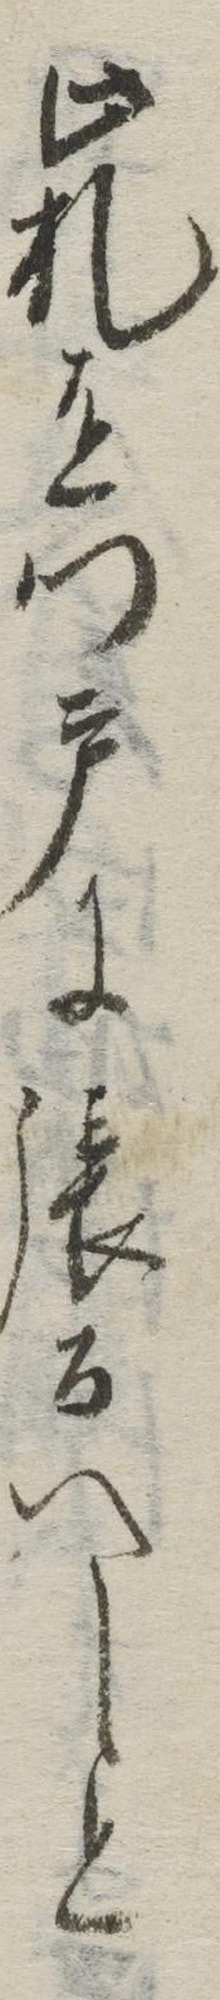此札を門戸に張るへしと
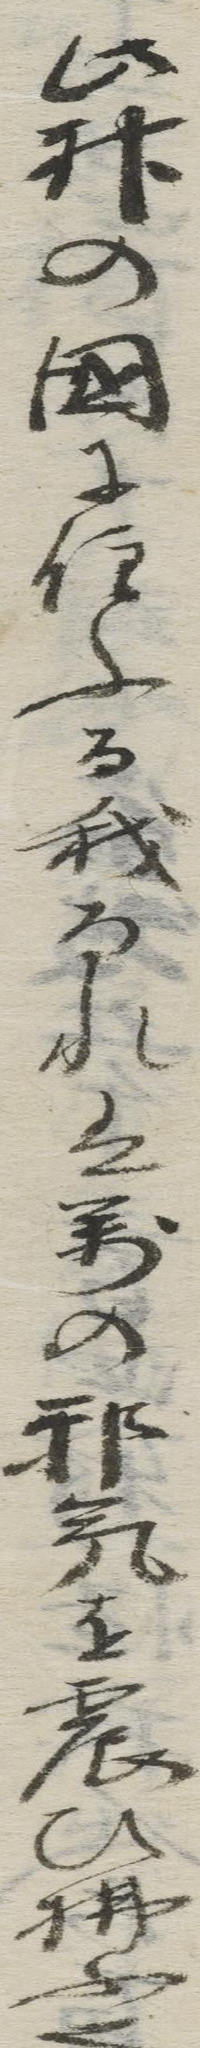此神の国に住ふる我なれは萬の邪気を震ひ払ふ也
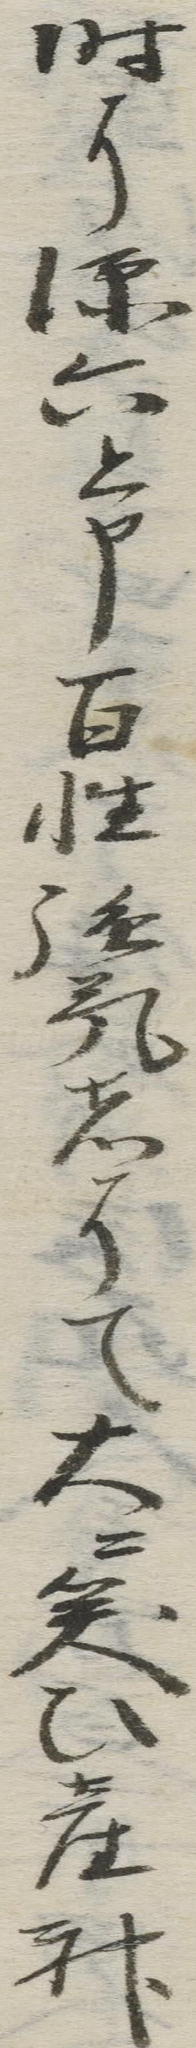時に源六と申百姓強気者にて大ニ笑ひ産神
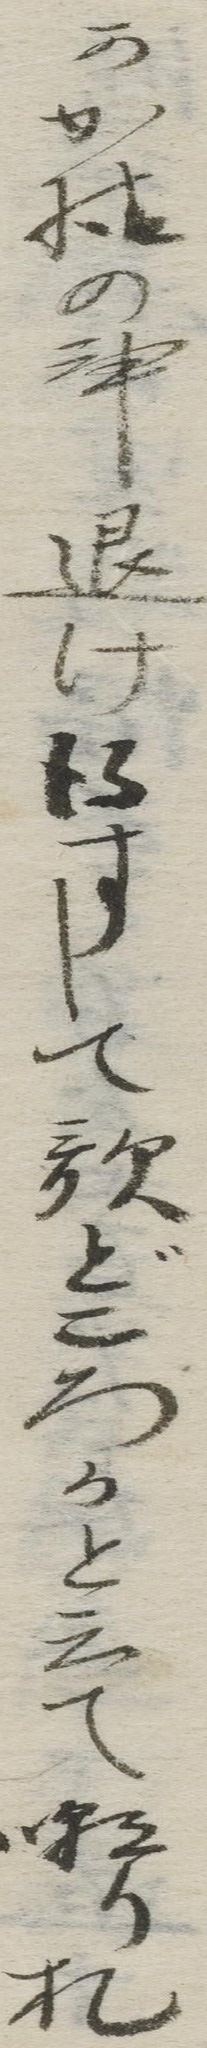かか様の事退け得すして歌どころかと云て嘲り札
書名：肥前國島原領普賢山大変記　完
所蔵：東京大学地震研究所図書室 Earthquake Research Institute Library, The University of Tokyo, JAPAN
